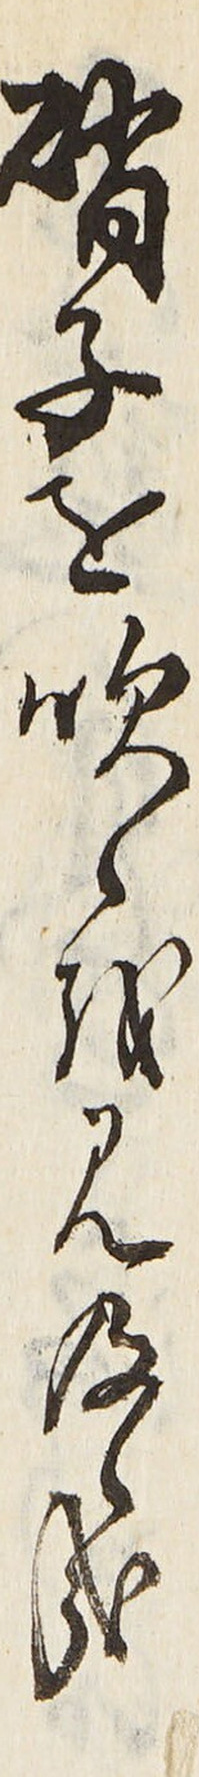硝子を吹候を見及候哉
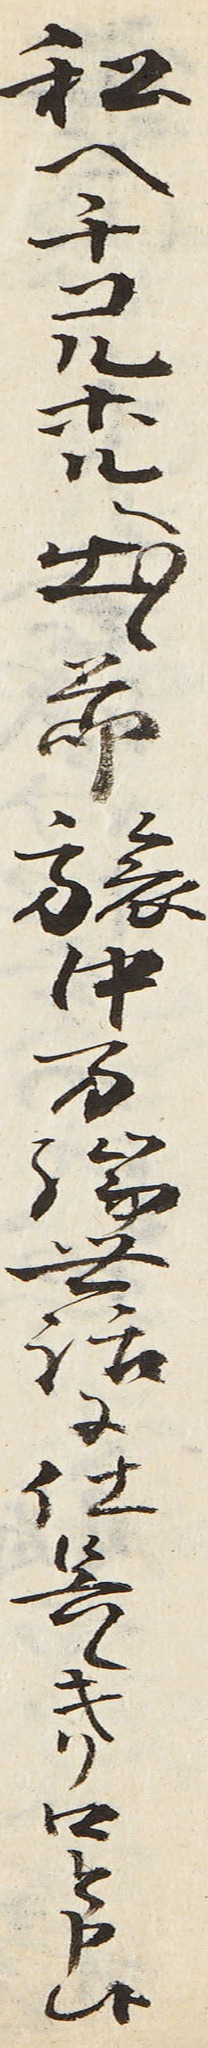私ヘチコルホルへ出候節旅中万端世話に仕呉候キリロと申候
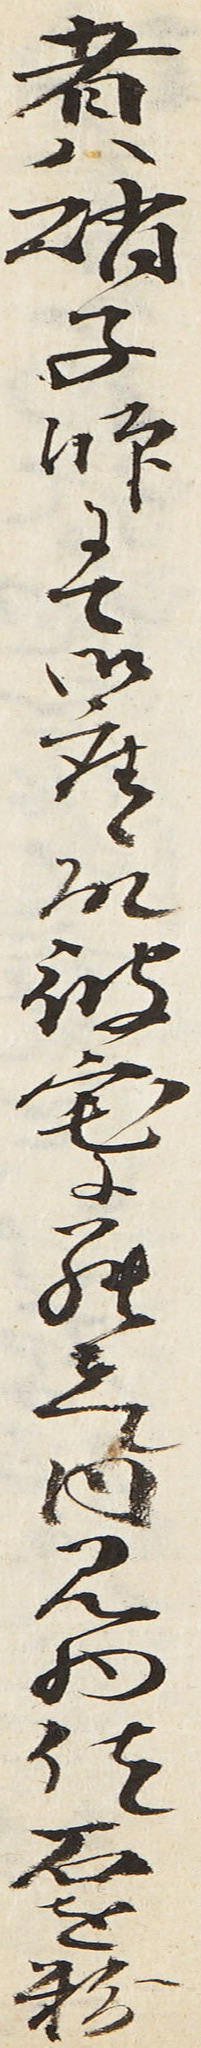者は硝子師にて御座候故彼宅に罷在候内見物仕候石を粉
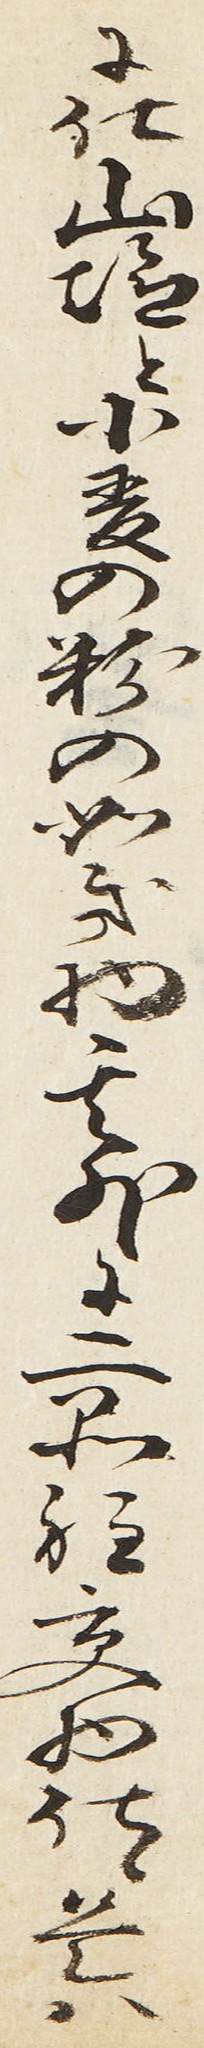に仕山塩と小麦の粉の如き物其外に二品程交物仕候是は
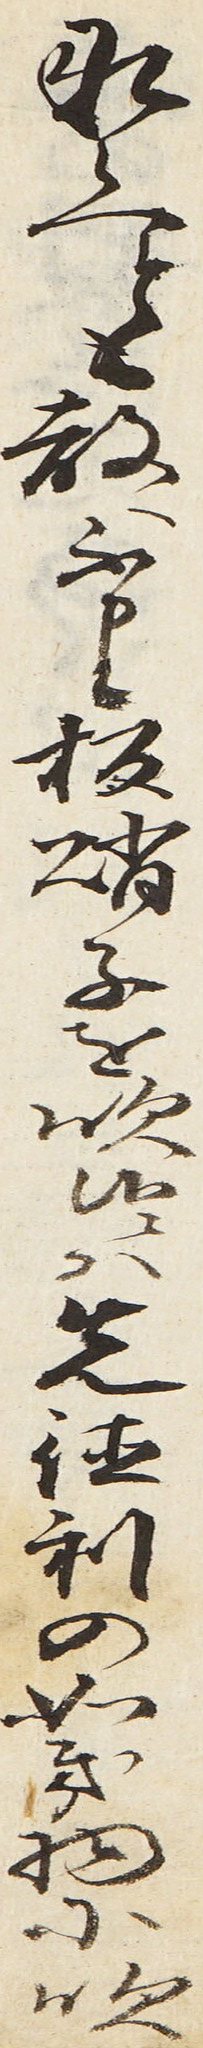承候へとも教へ不申候板硝子を吹候には先徳利の如き物に吹
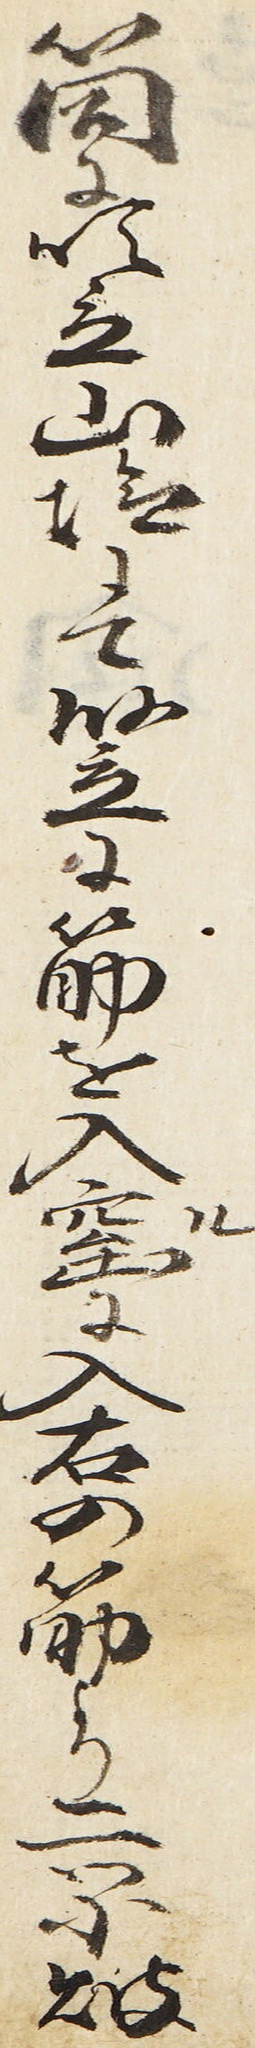筒に吹立山塩にて竪に筋を入る窑に入右の筋より二つに破
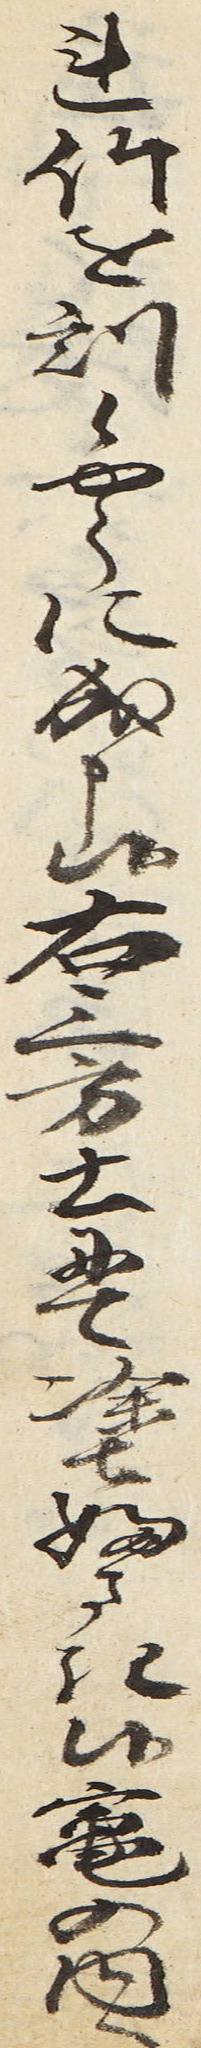れ竹を割候やうに成申候右三方土にて塗ふさき候竃の内へ

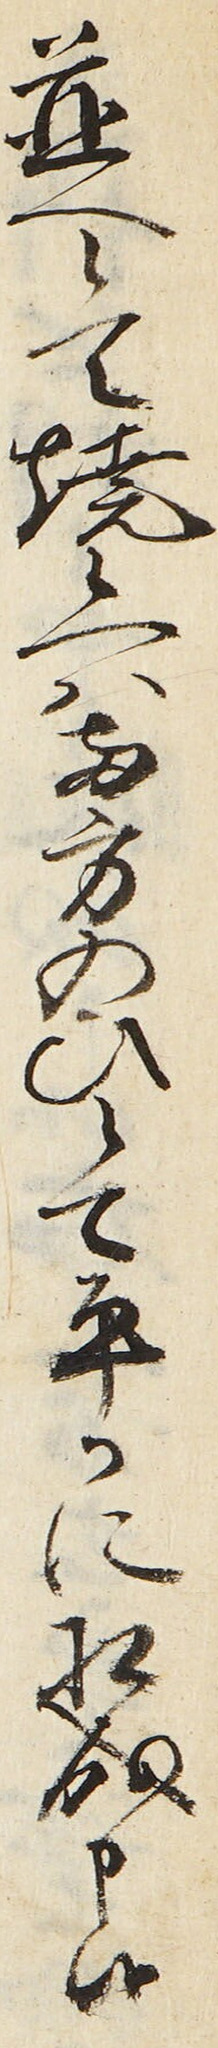並へ候て焼候へは両方のひ候て平かに相成申候
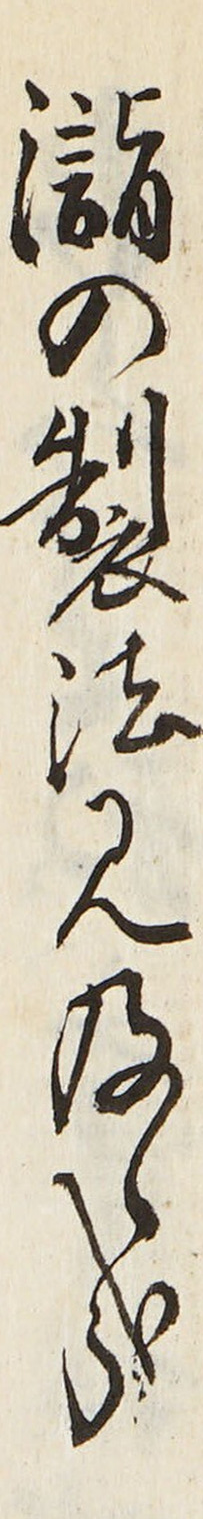𣿉の製法見及候哉
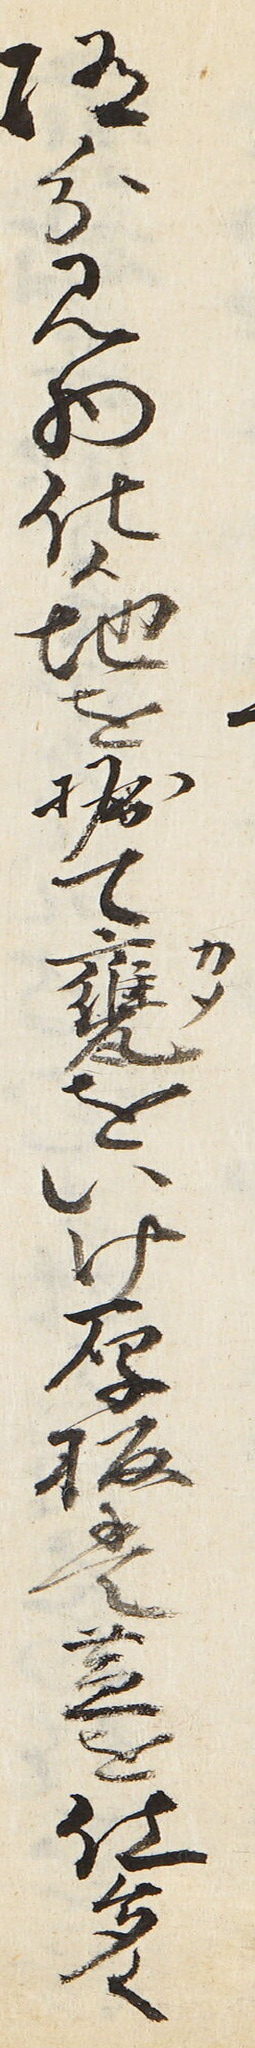随分見物仕候地を掘て甕をいけ厚板にて蓋を仕多く
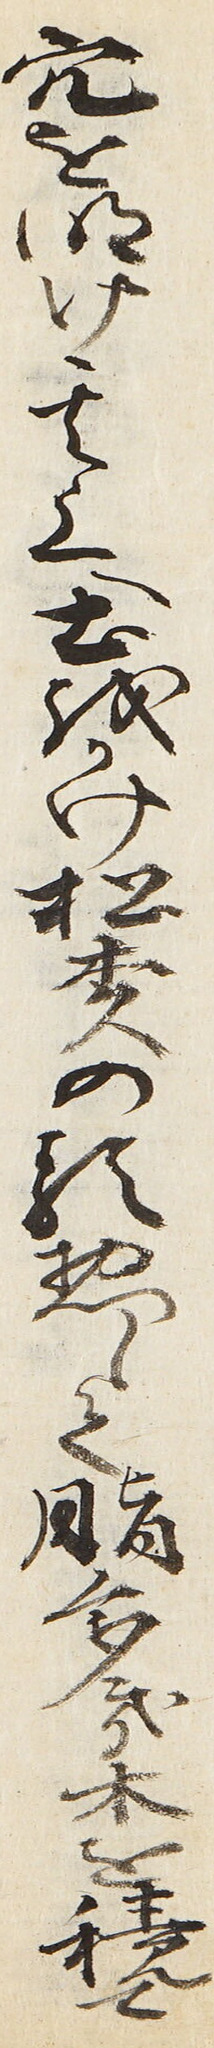穴を明け其上へ土をかけ松杦の類惣して脂多き木を積て
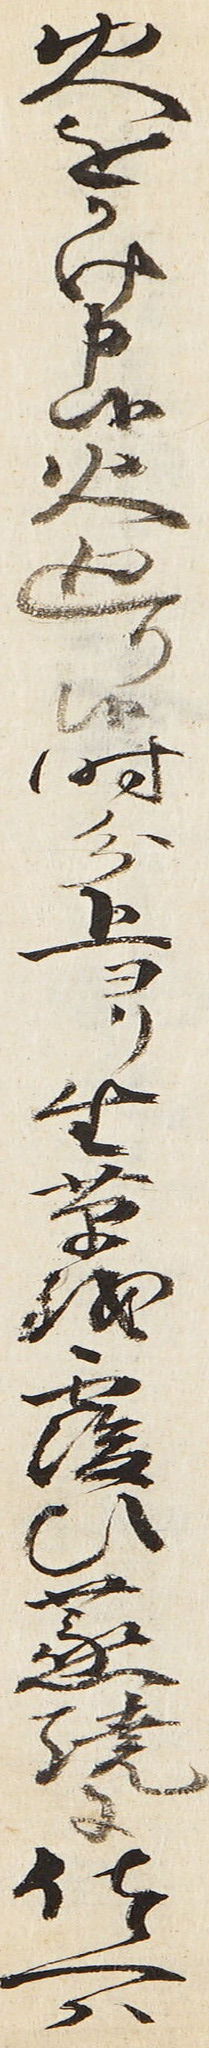火をかけ申候火廻り候時分上より生草を覆ひ蒸焼に仕候へは
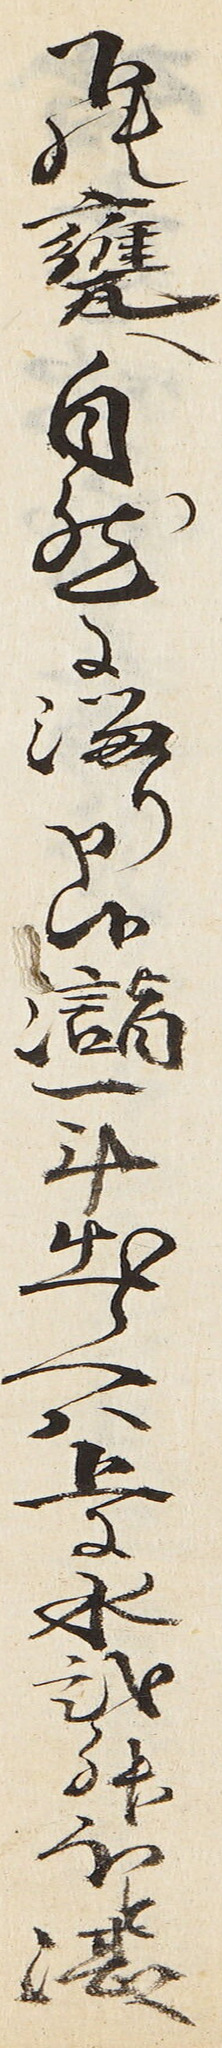下の甕へ自然に溜り申候𣿉一斗出候へは上に水弐升ほと湛へ
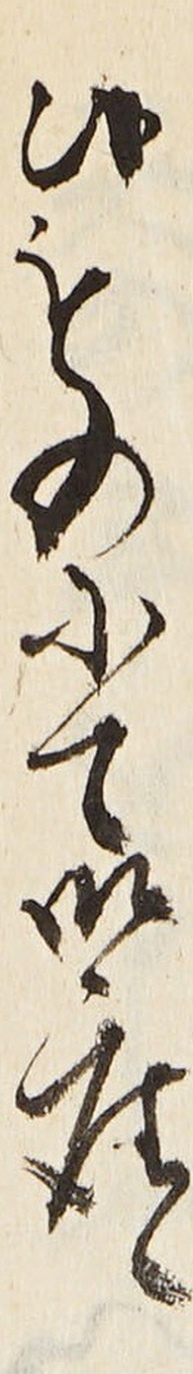候ものにて御座候
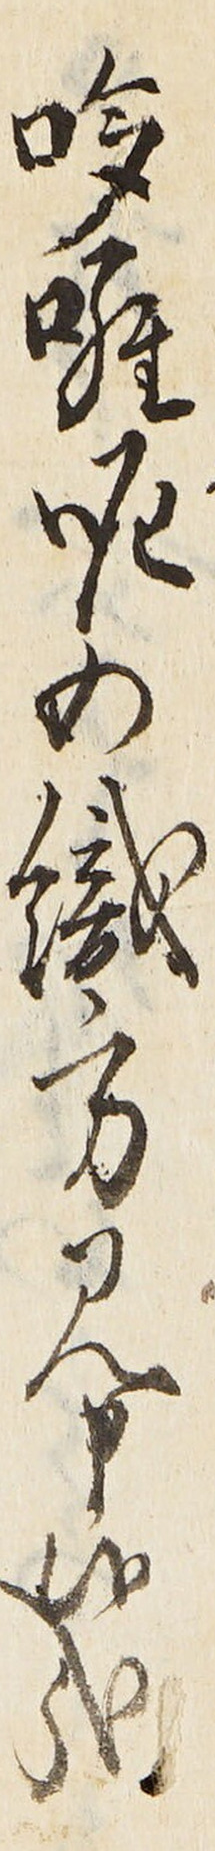哆囉呢の織方見申候哉
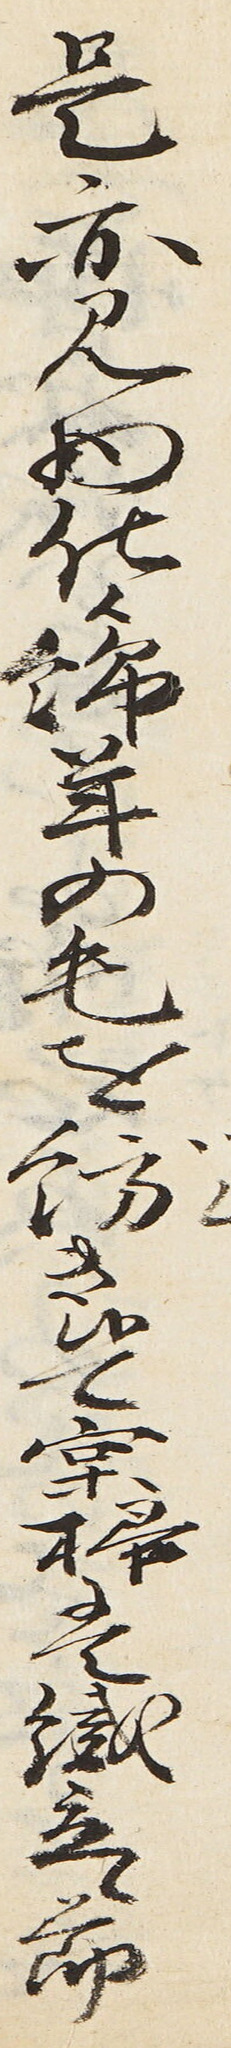是亦見物仕候綿羊の毛を紡き候て宲にて織立候節
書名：漂民御覧之記
